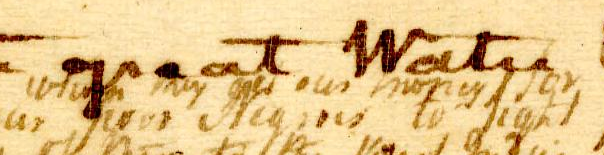when they get our money for
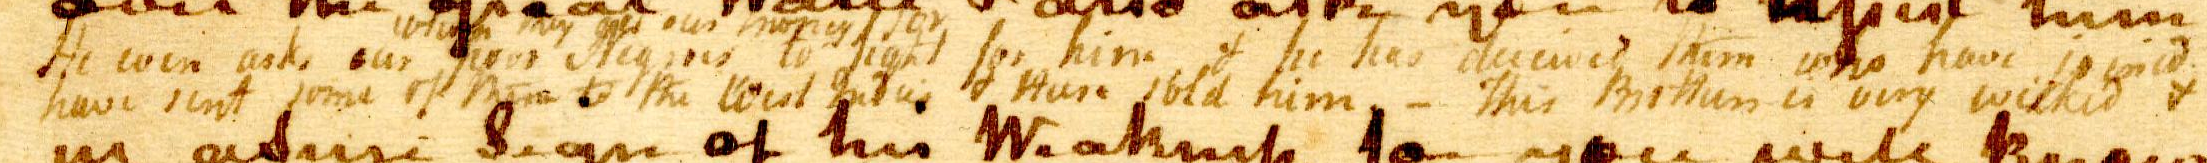have sent some of these to the West Indies & there sold him.- This Brothers is very wicked &
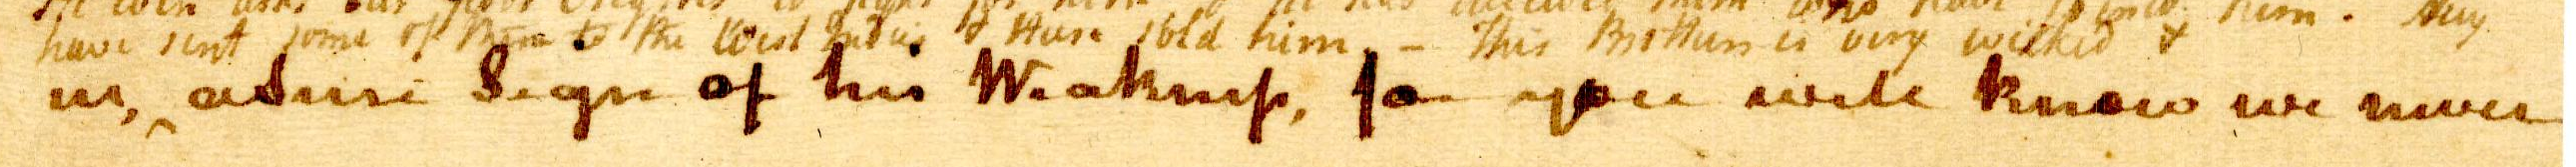us, ^ a dire Sign of his Weakness, for you well know we never
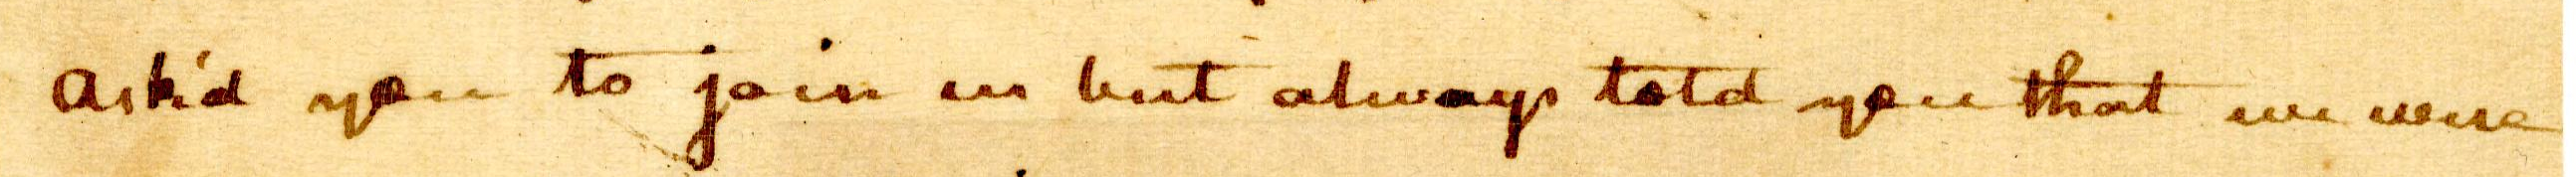ask'd you to join us but always told you that we were
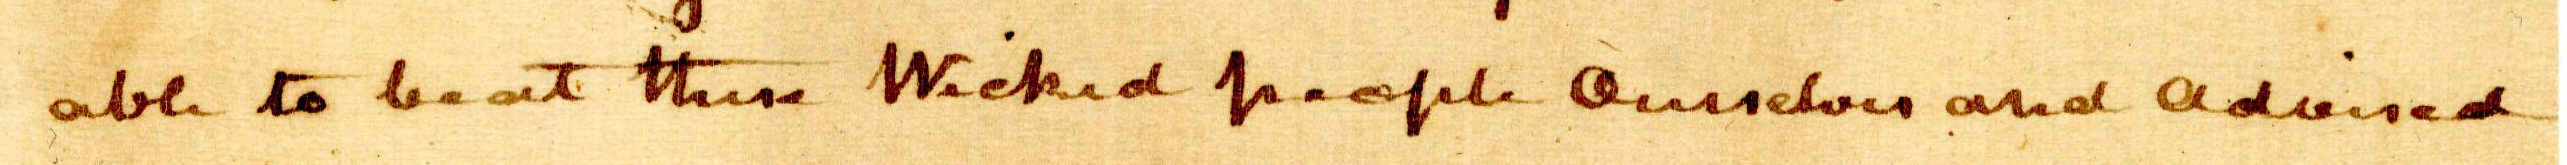able to beat these Wicked People ourselves and advised
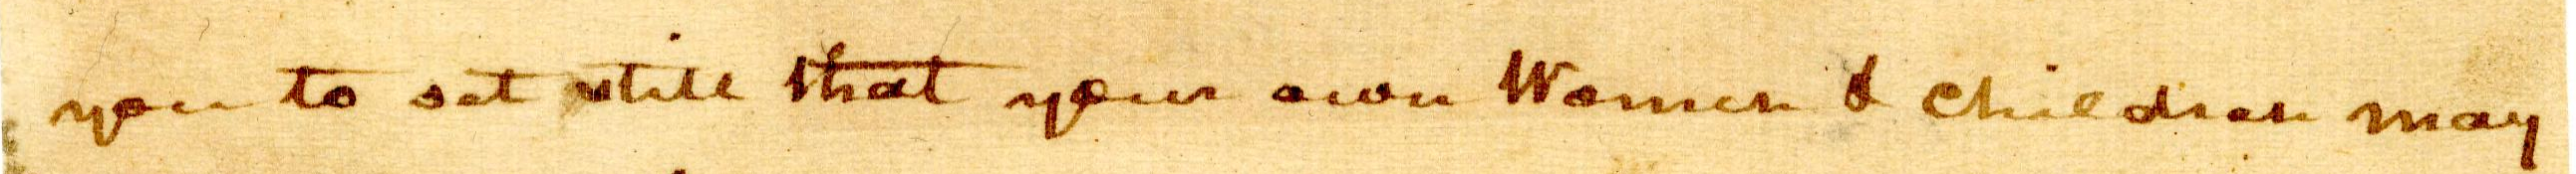you to sit still that your own Women & Children may
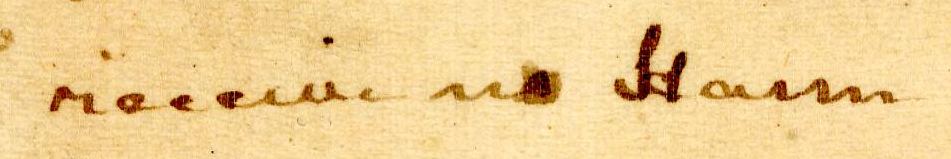receive no Harm
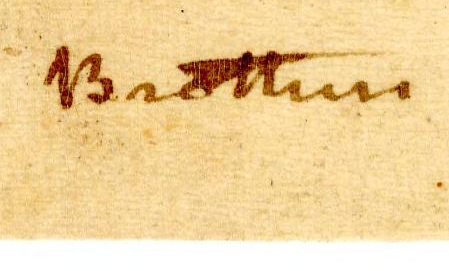Brothers
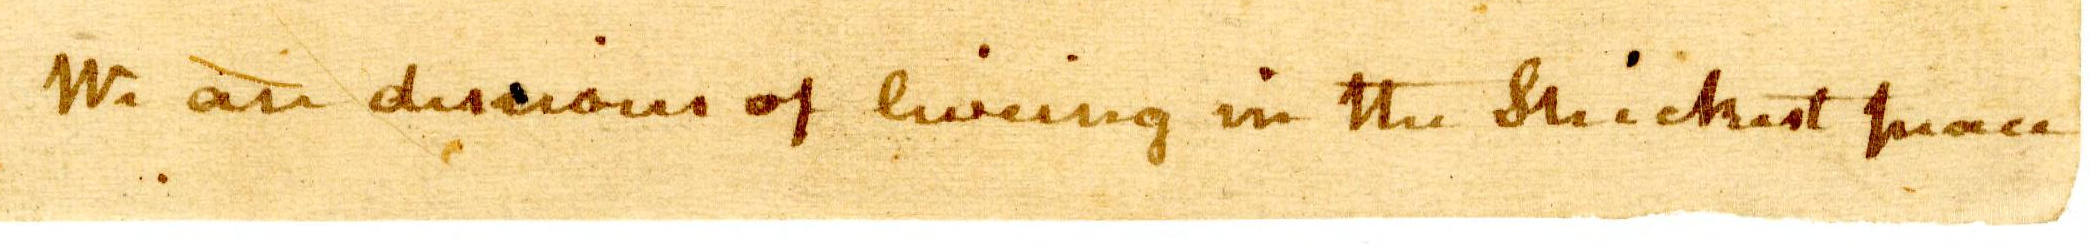We are desirous of liveing in the Strickest peace
